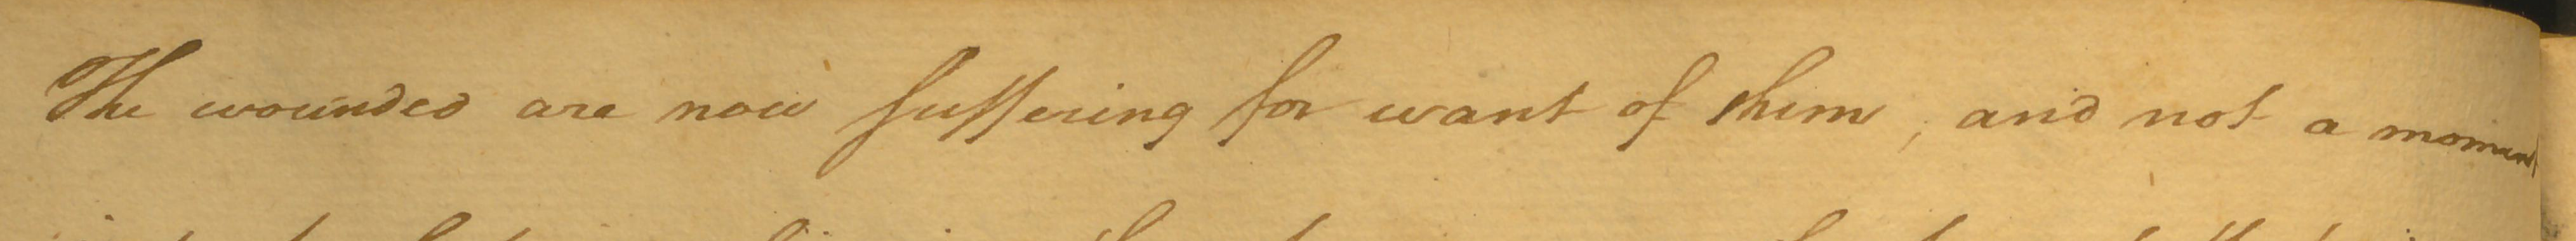The wounded are now suffering for want of them, and not a moment
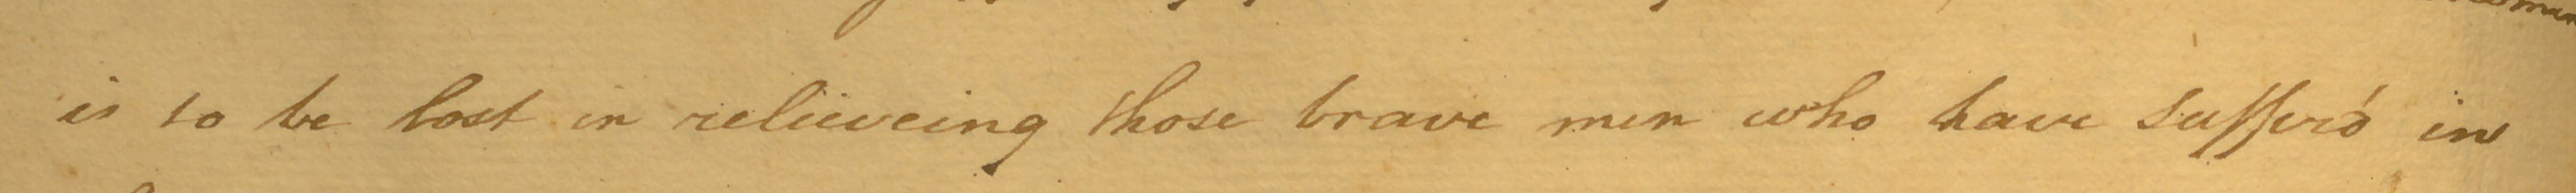is to be lost in relieving those brave men who have suffer'd in
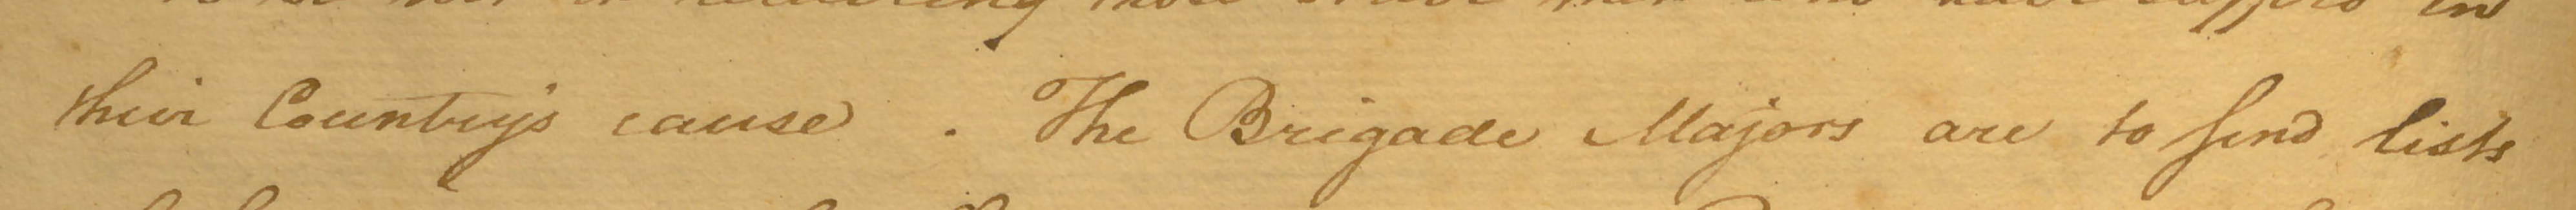their Country's cause. The Brigade Majors are to find lists
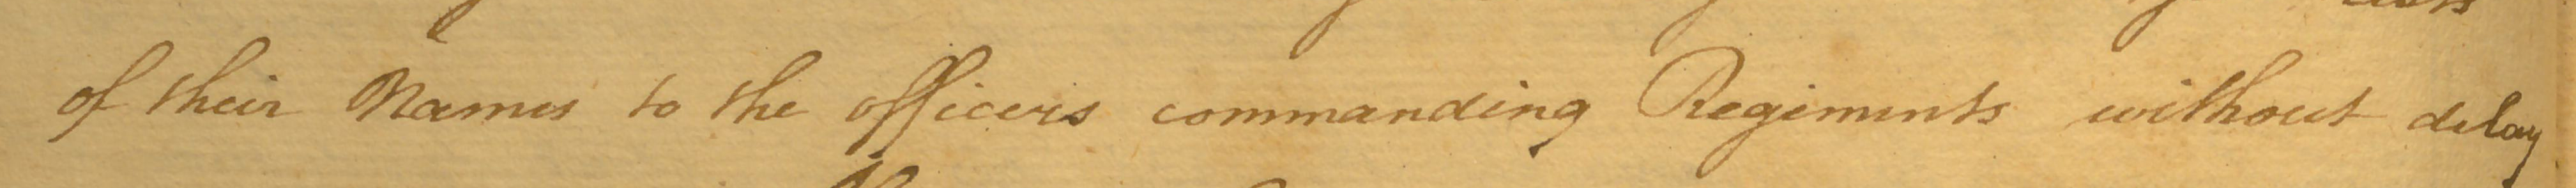of their Names to the officers commanding Regiments without delay
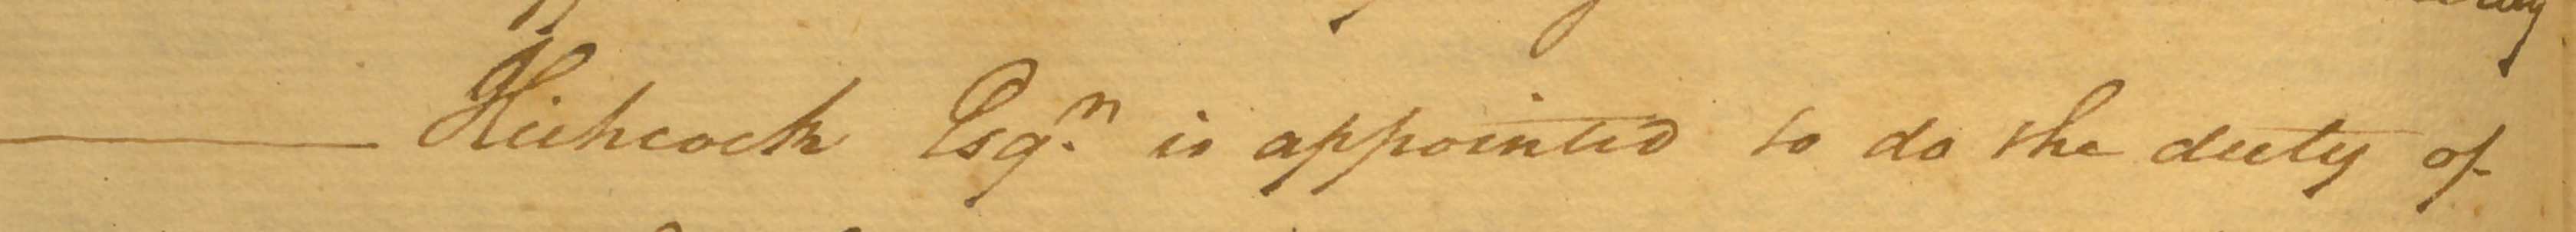-Hichcock Esq^r. is appointed to do the duty of
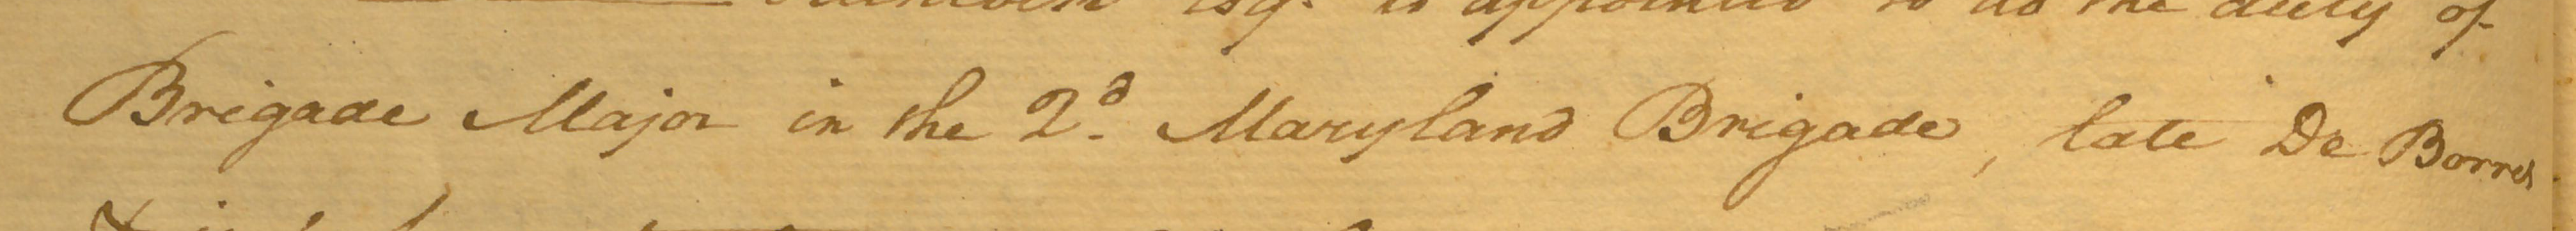Brigade Major in the 2^d. Maryland Brigade, late De Borres
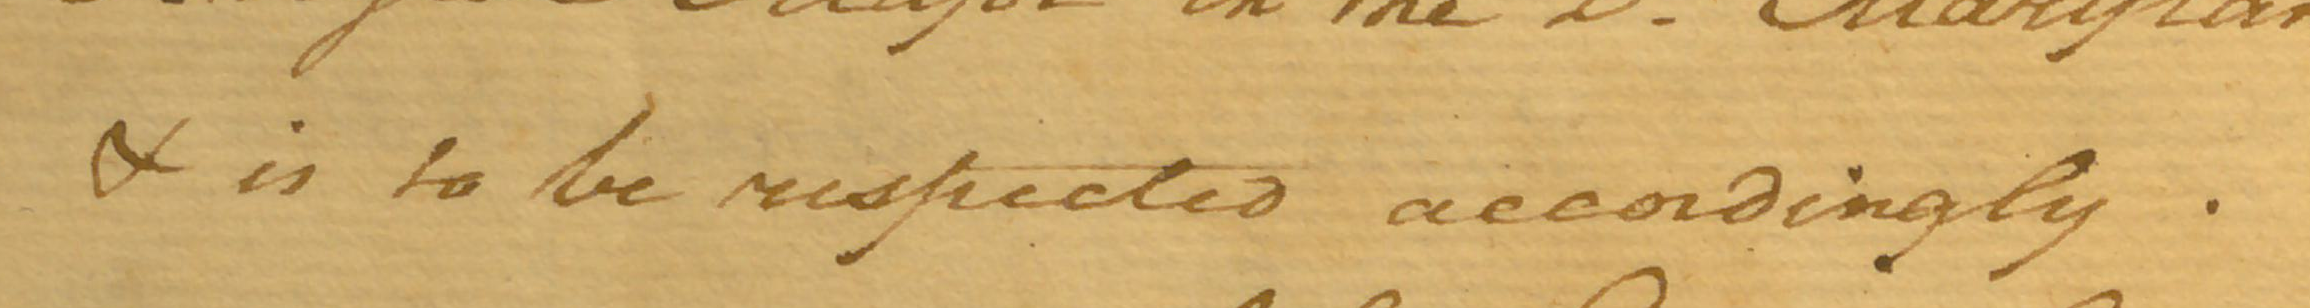& is to be respected accordingly.
